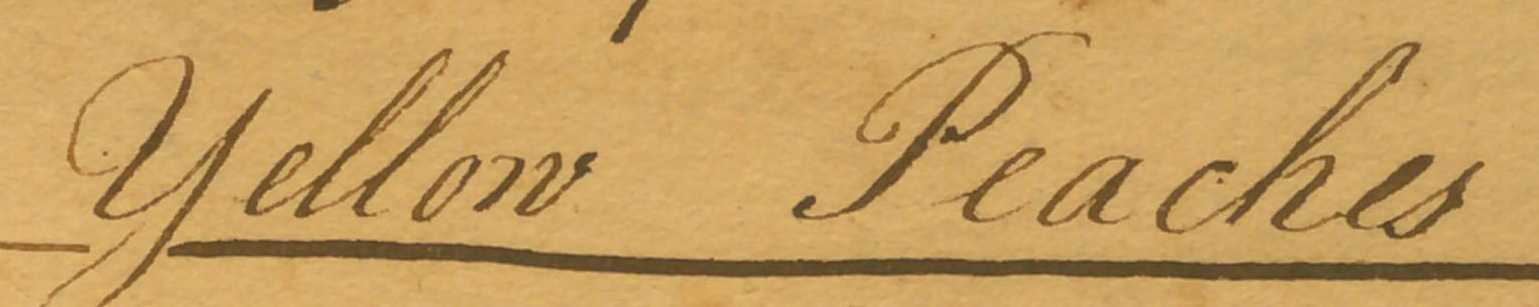Yellow Peaches
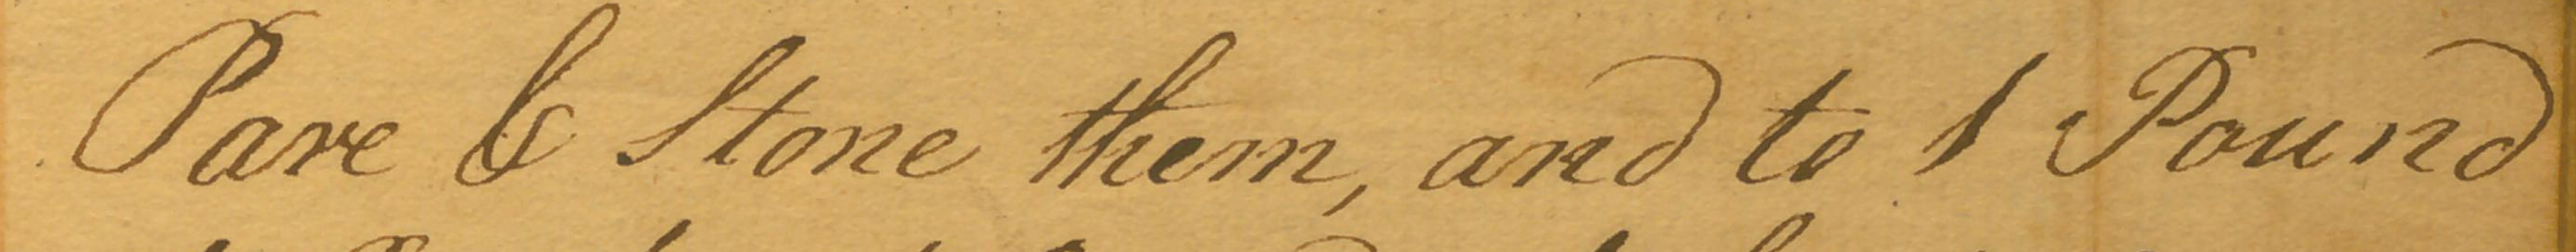Pare & stone them, and to 1 Pound
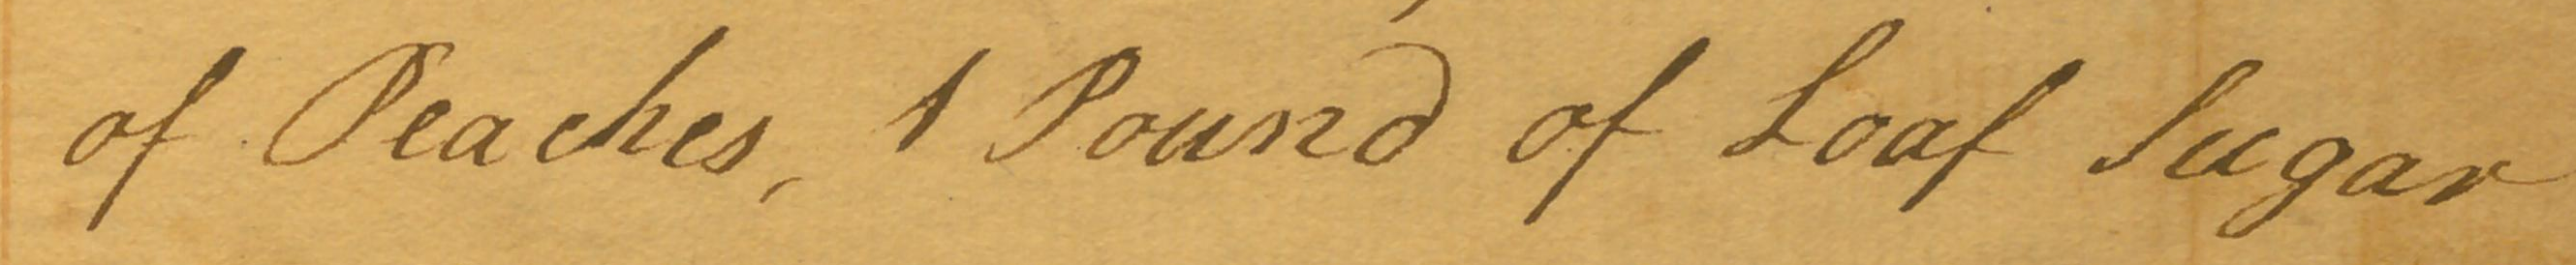of Peaches, 1 Pound of Loaf sugar
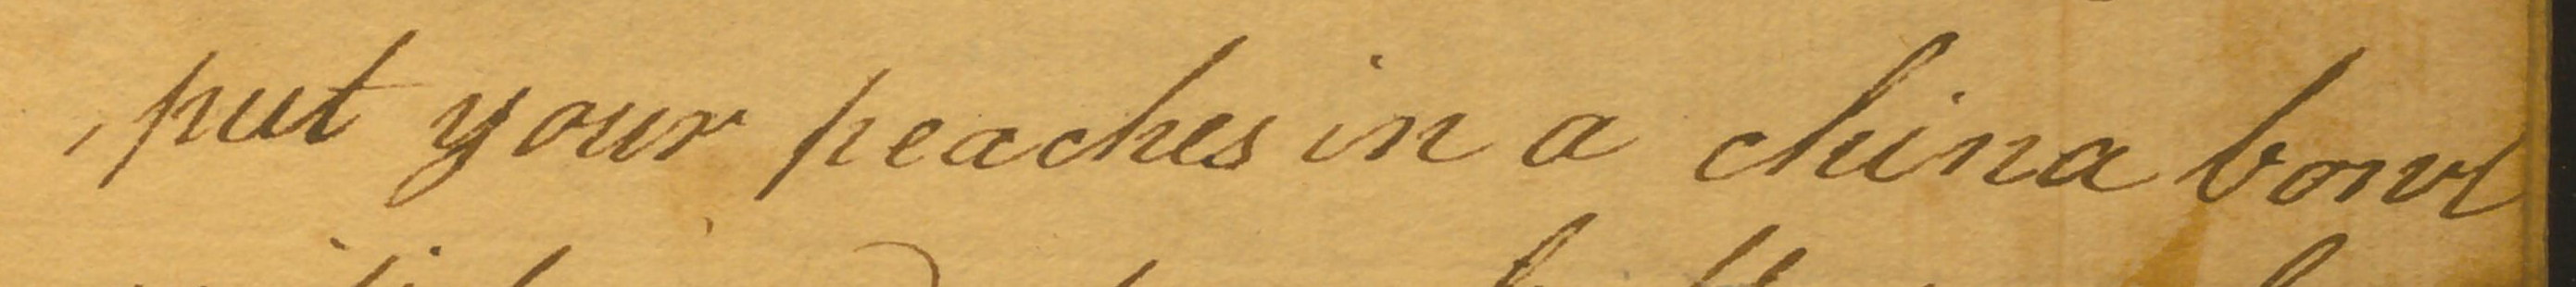put your peaches in a china bowl
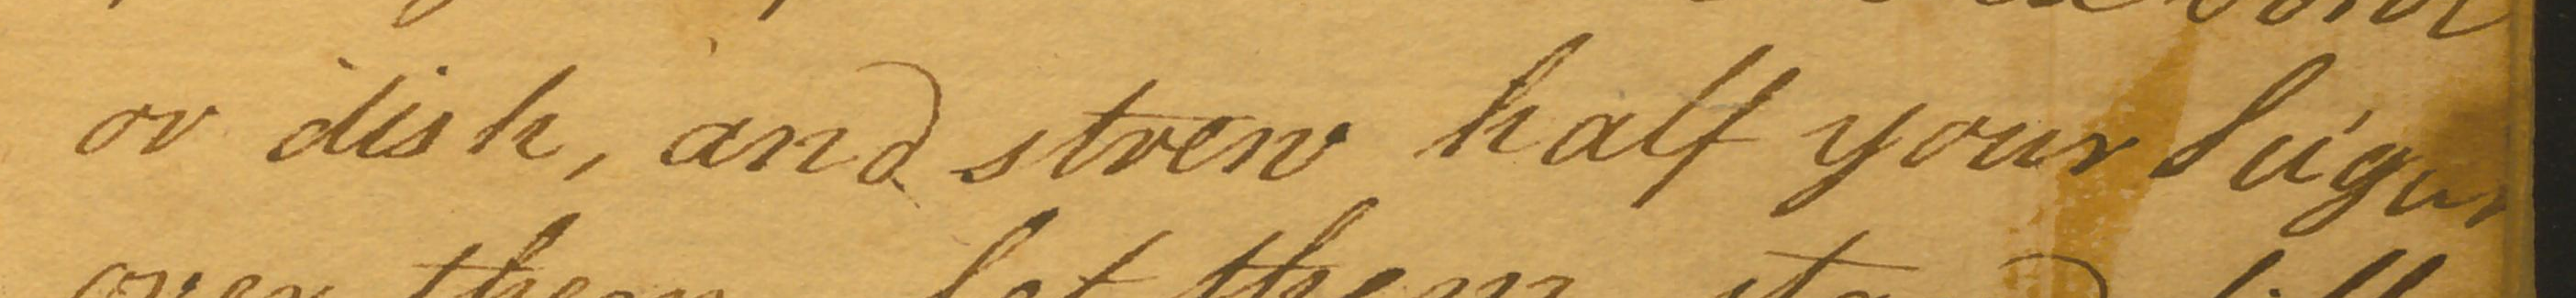or dish, and strew half your sugar
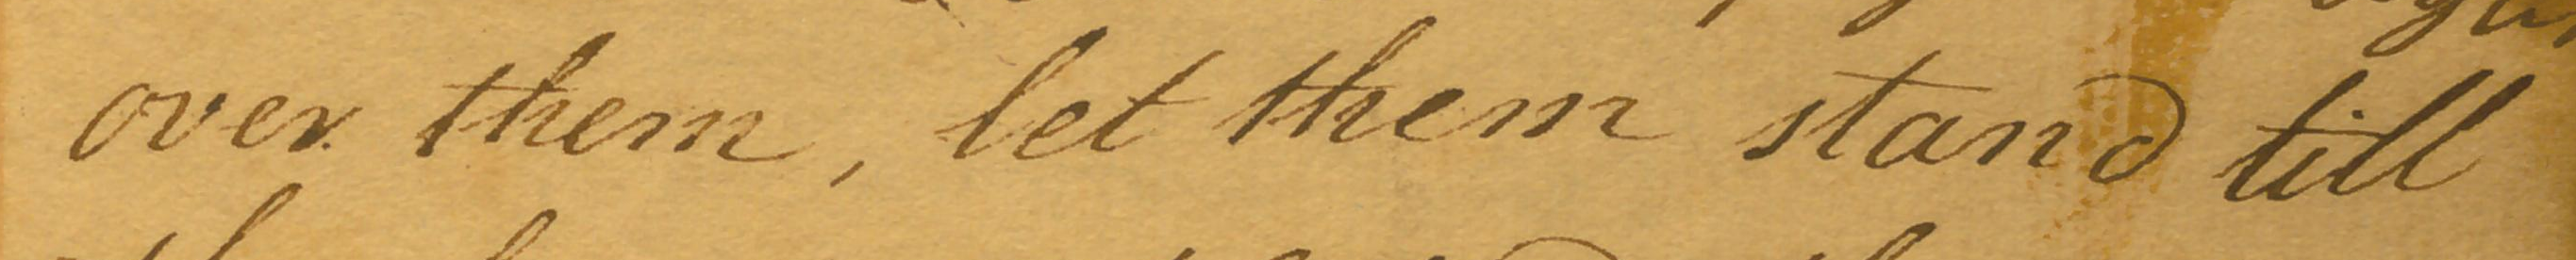over them, let them stand till
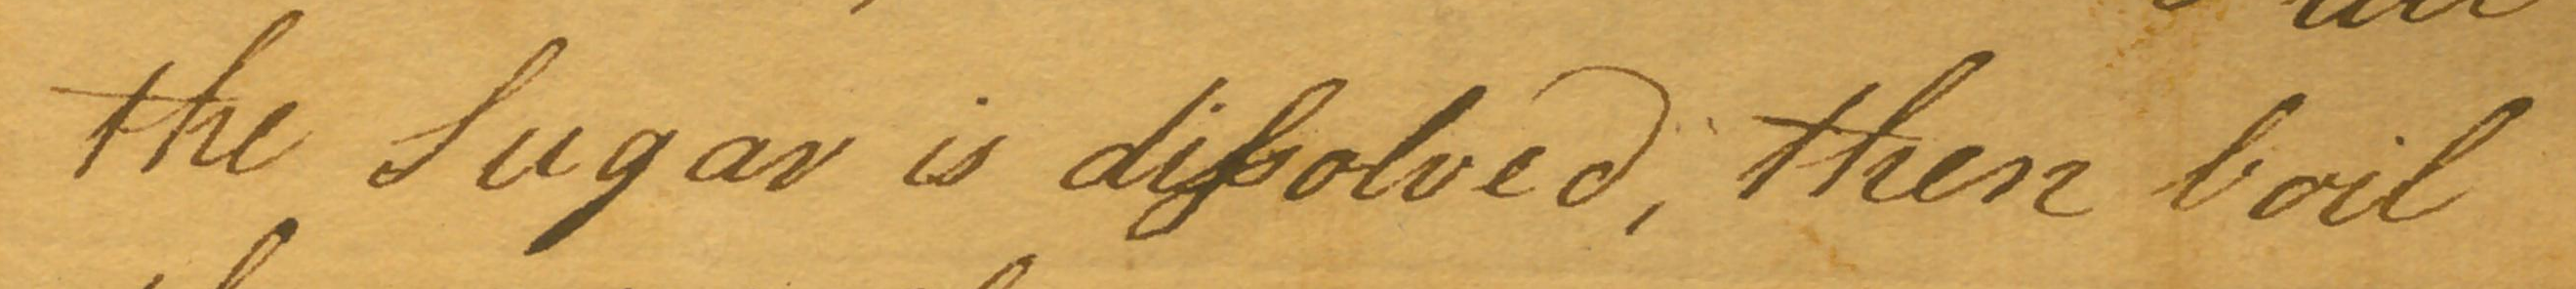the sugar is dissolved, then boil
